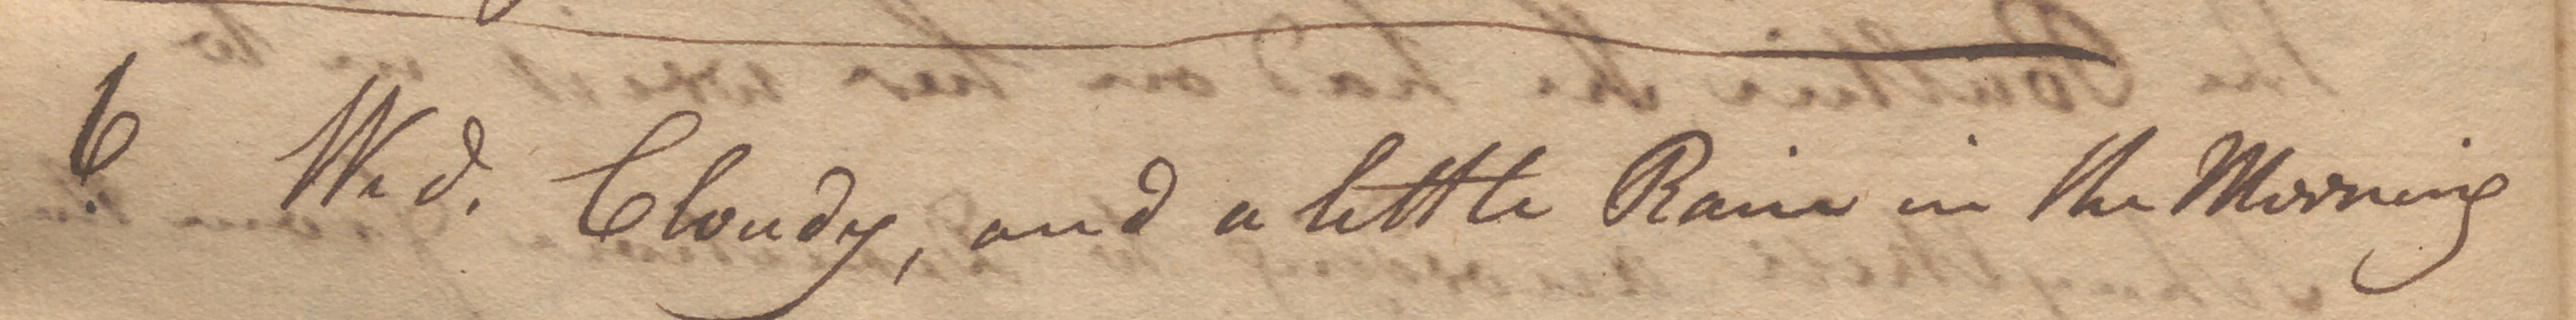6 Wed. Cloudy, and a little Rain in the Morning
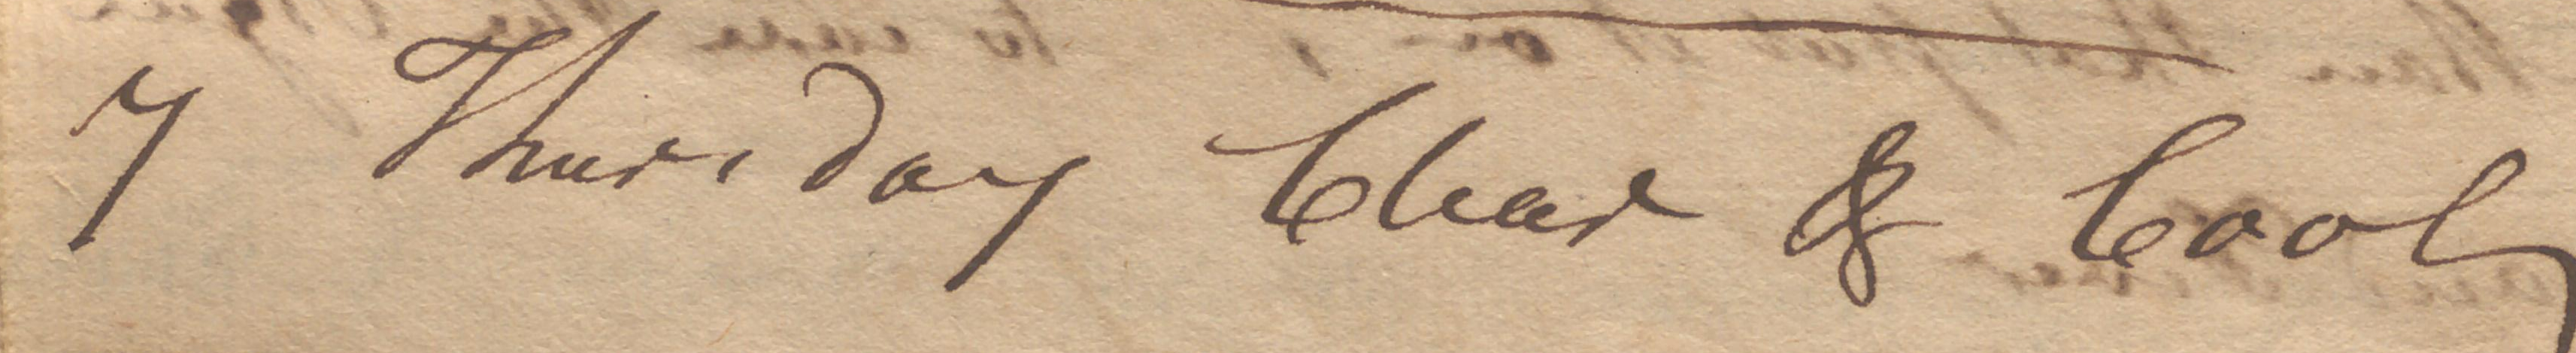7 Thursday Clear & Cool
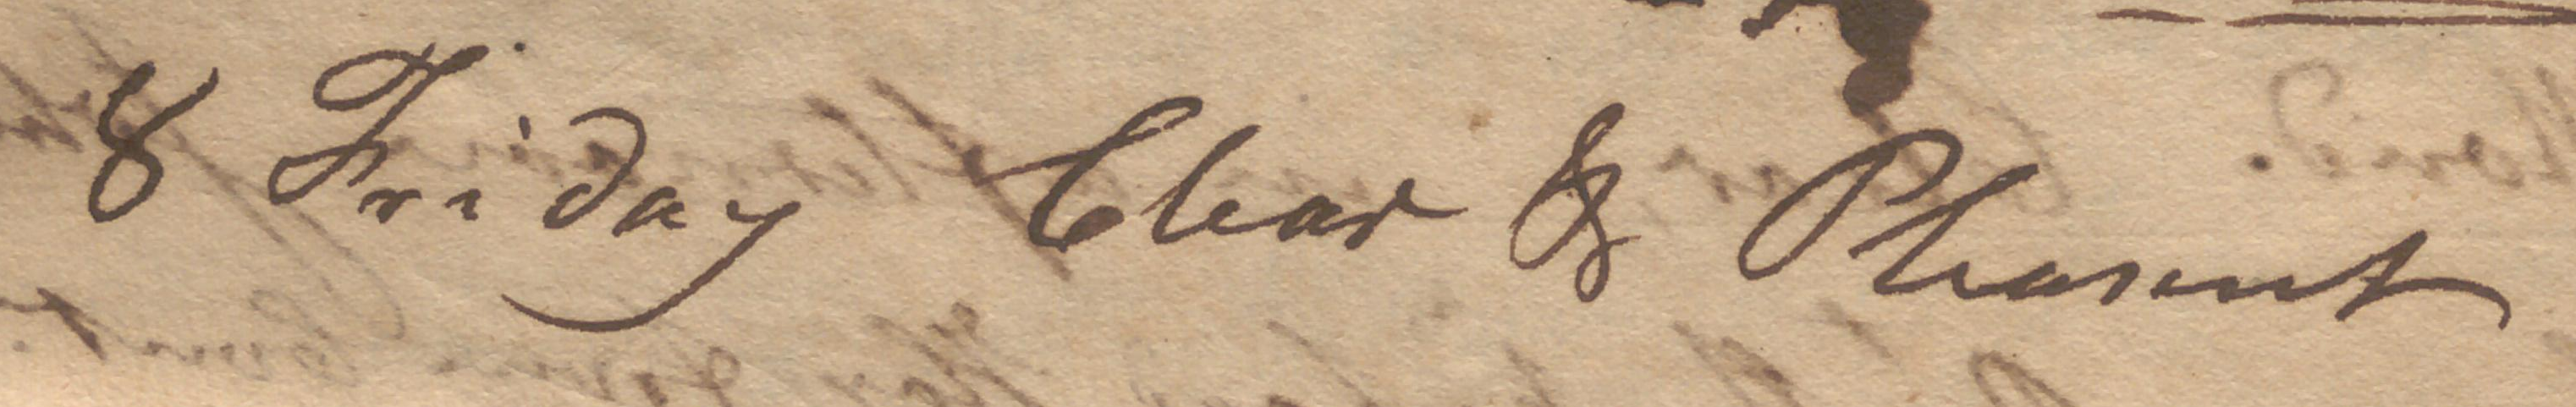8 Friday Clear & Pleasent
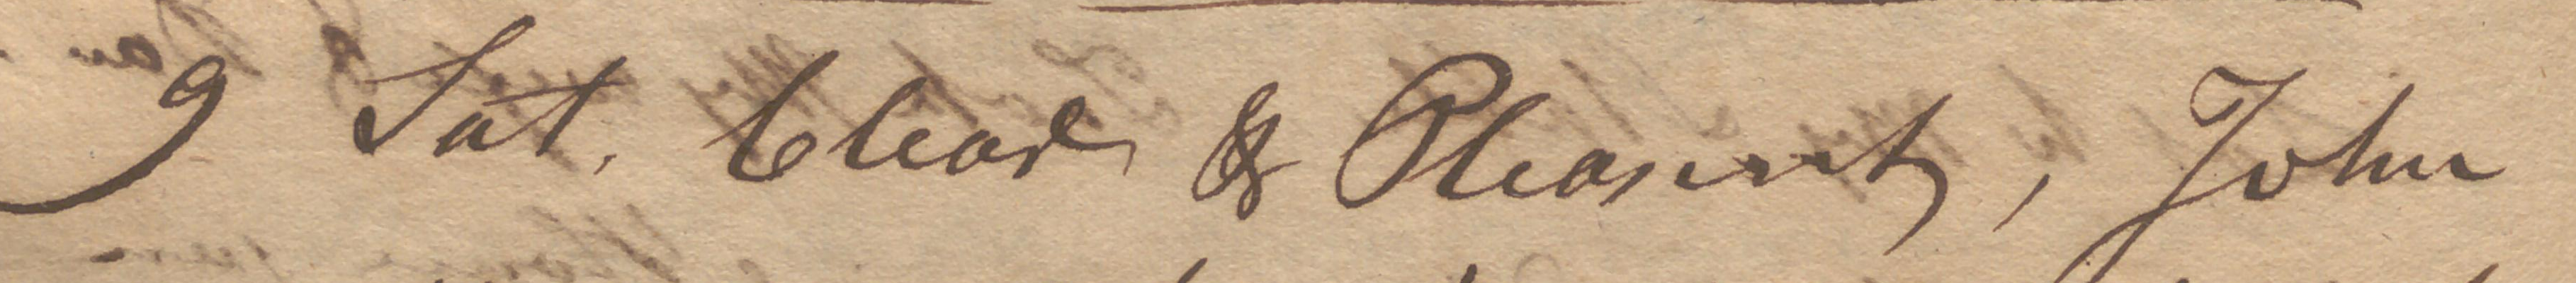9^r Sat. Clear & Pleasent, John
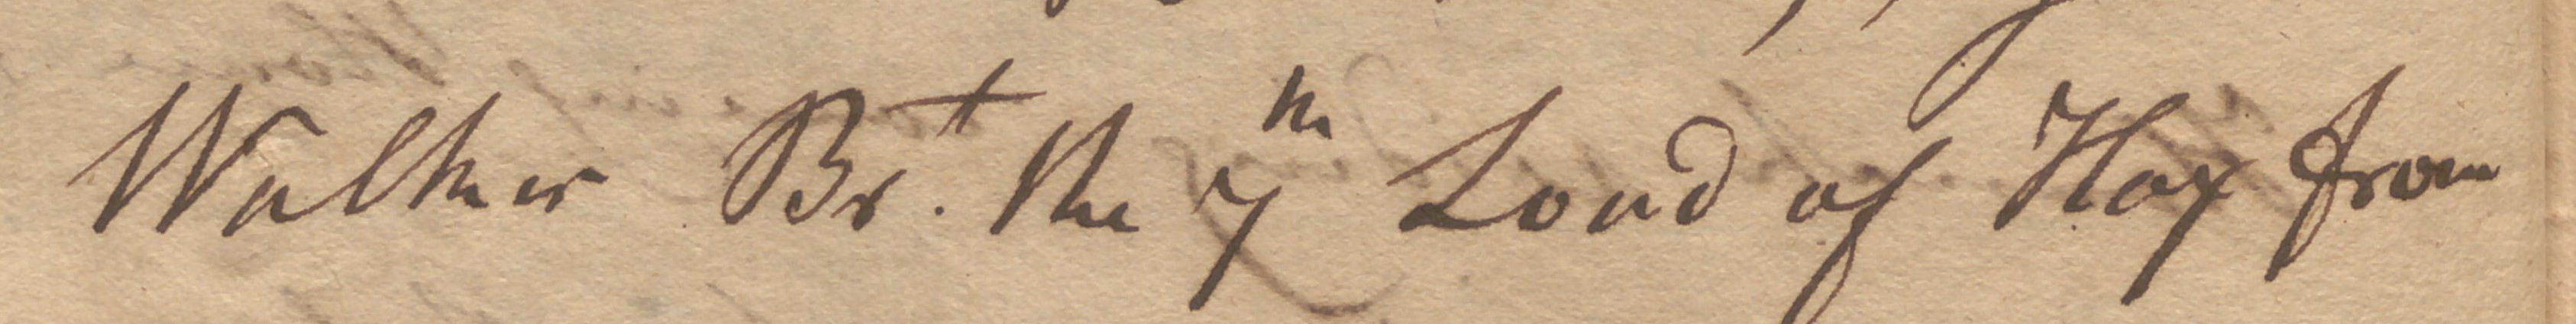Walker Br^t. the 7^th Load of Hay from
